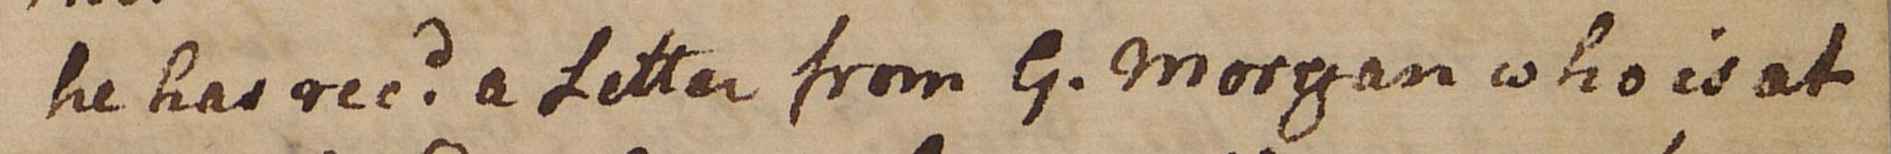he has rec^d. a Letter from G. Morgan who is at
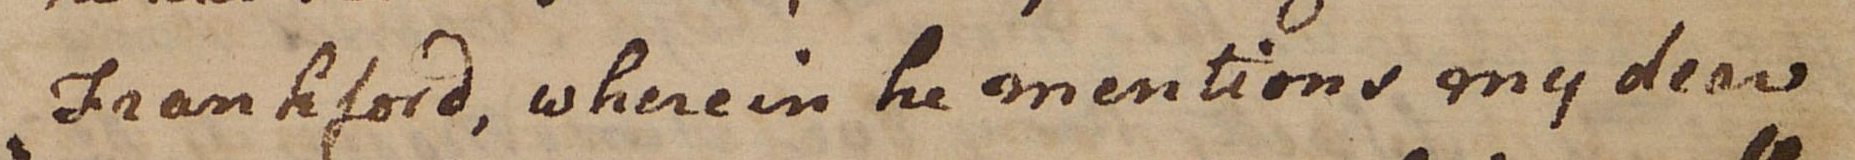Frankford, wherein he mentions my dear
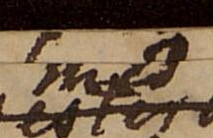this
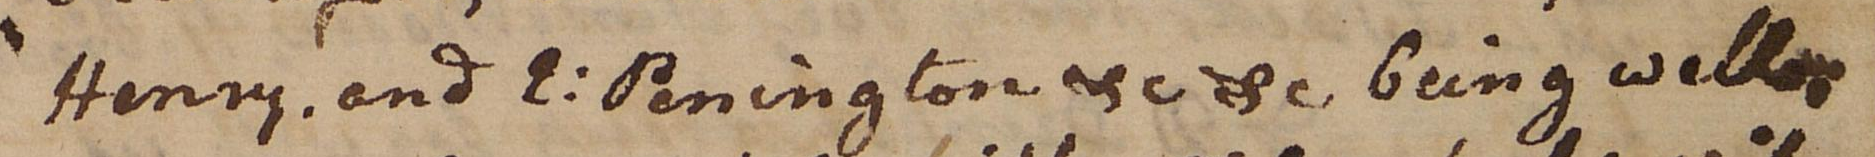Henry, and E: Penington &c &c being well
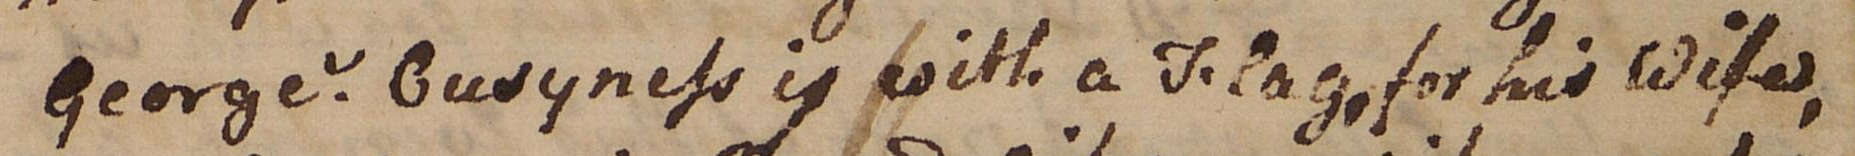George^s. Busyness is with a Flag, for his Wife,
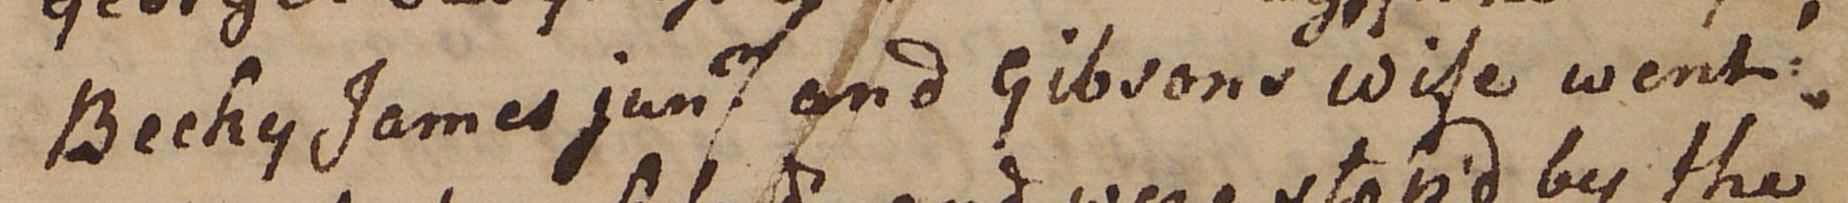Becky James jun^r. and Gibsons wife went.
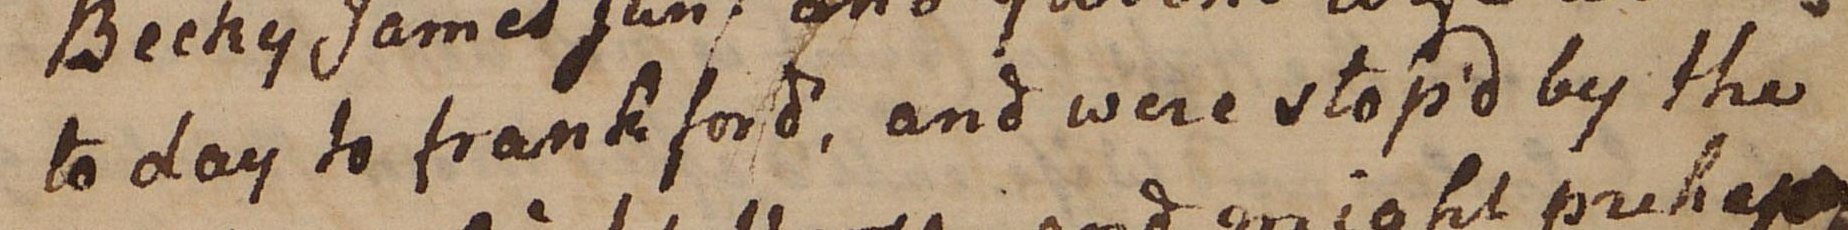to day to frank ford, and were stop'd by the
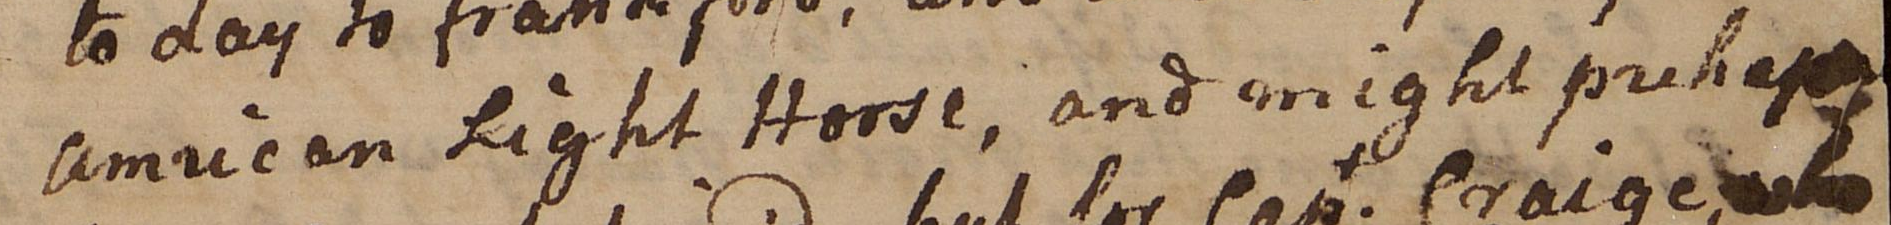Amrican Light Horse, and might prehap
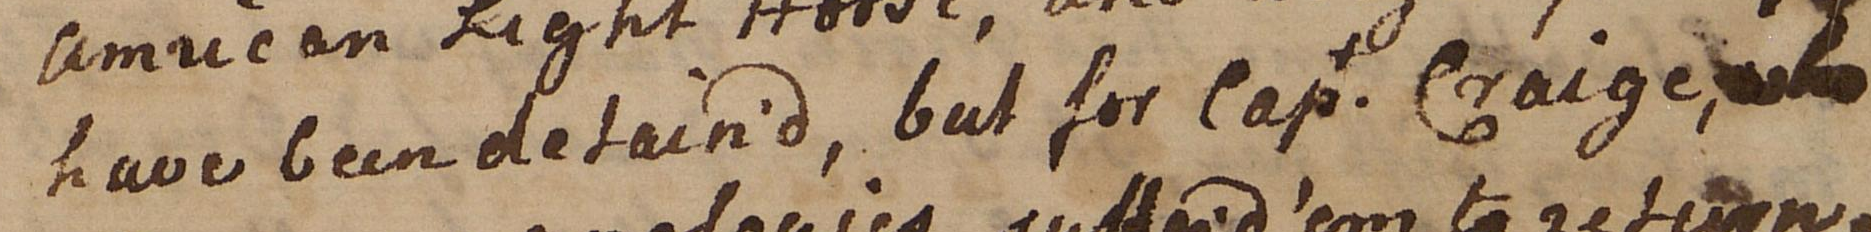have been detain'd, but for Cap^t. Craige, who
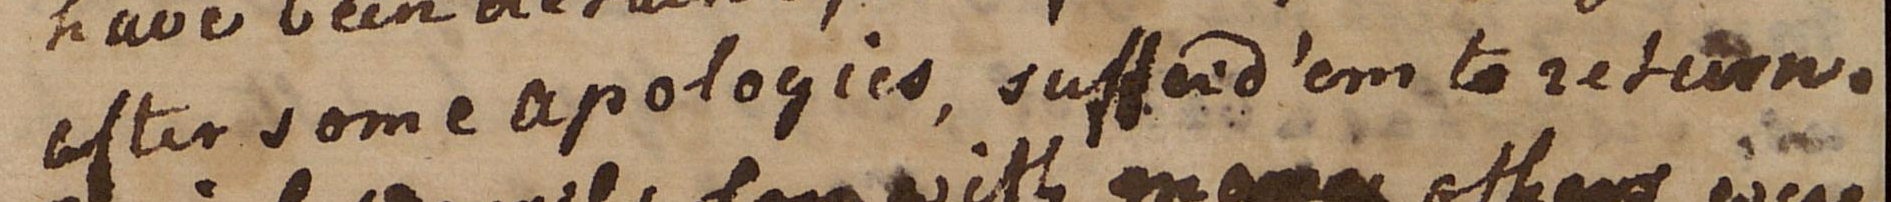after some apologies, suffer'd 'em to return.
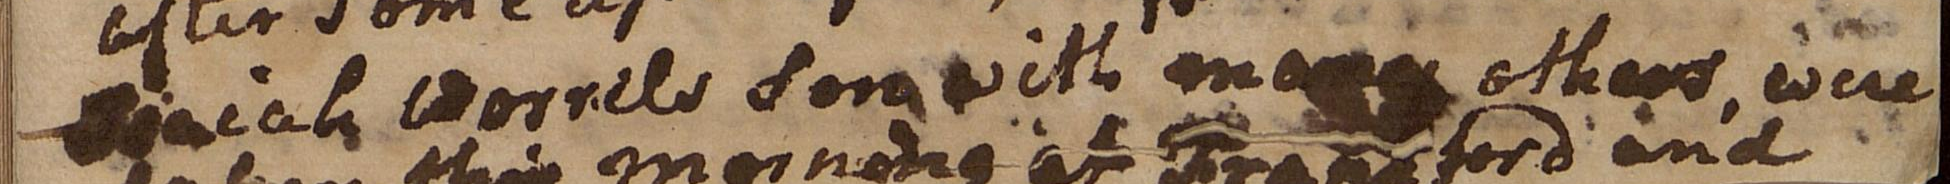Josiah Worrels Son with many others, were
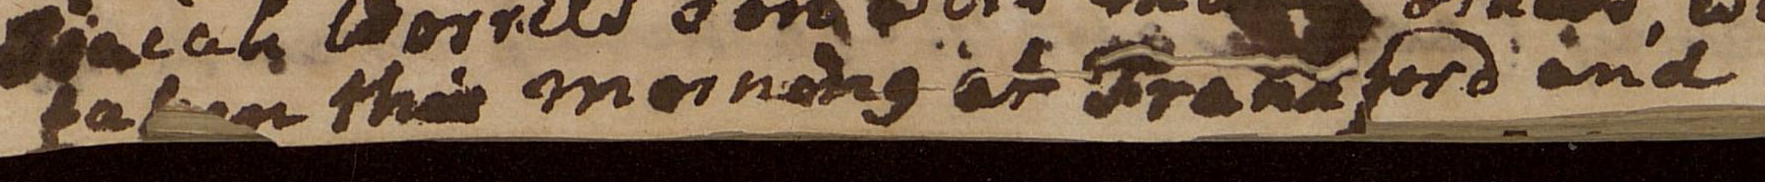taken this morning at Frankford and
